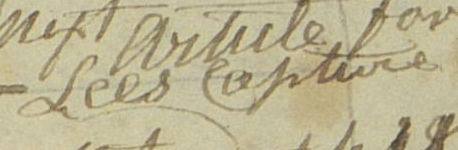Lees Ccpture
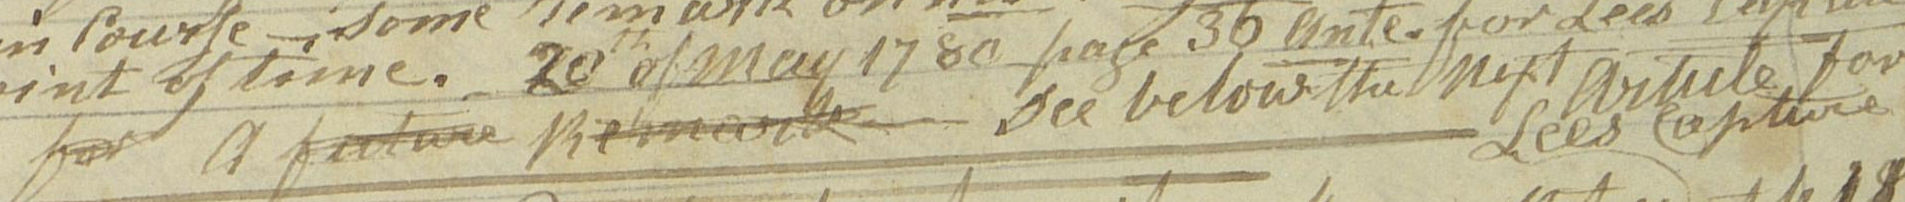for a future Remark See below the next Article for
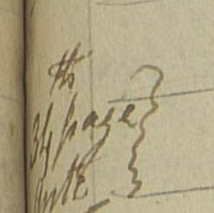34^th page
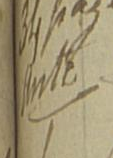Ante
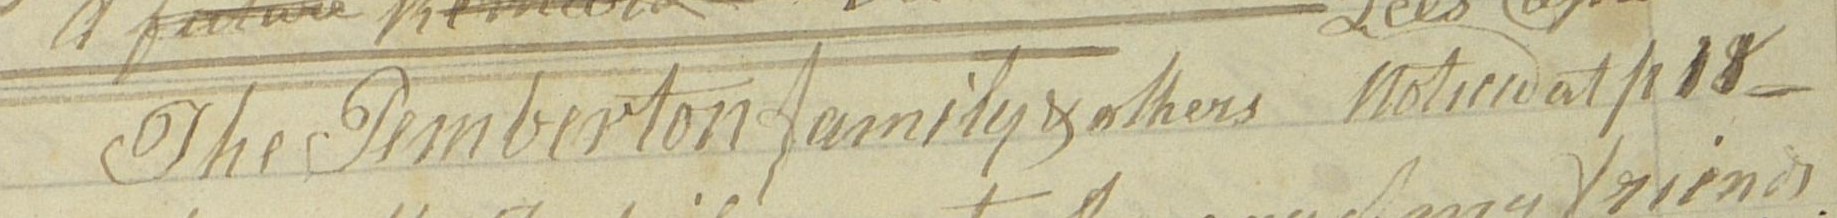The Pemberton family & others Noticed at p 11
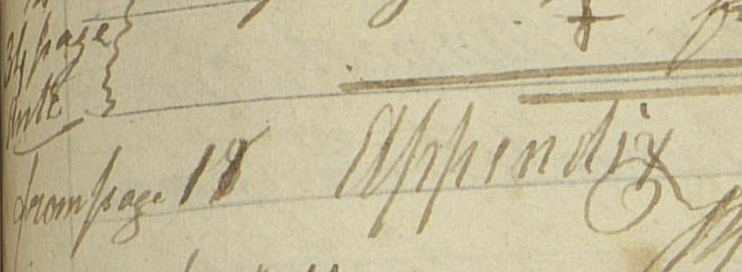from page 11 Appendix
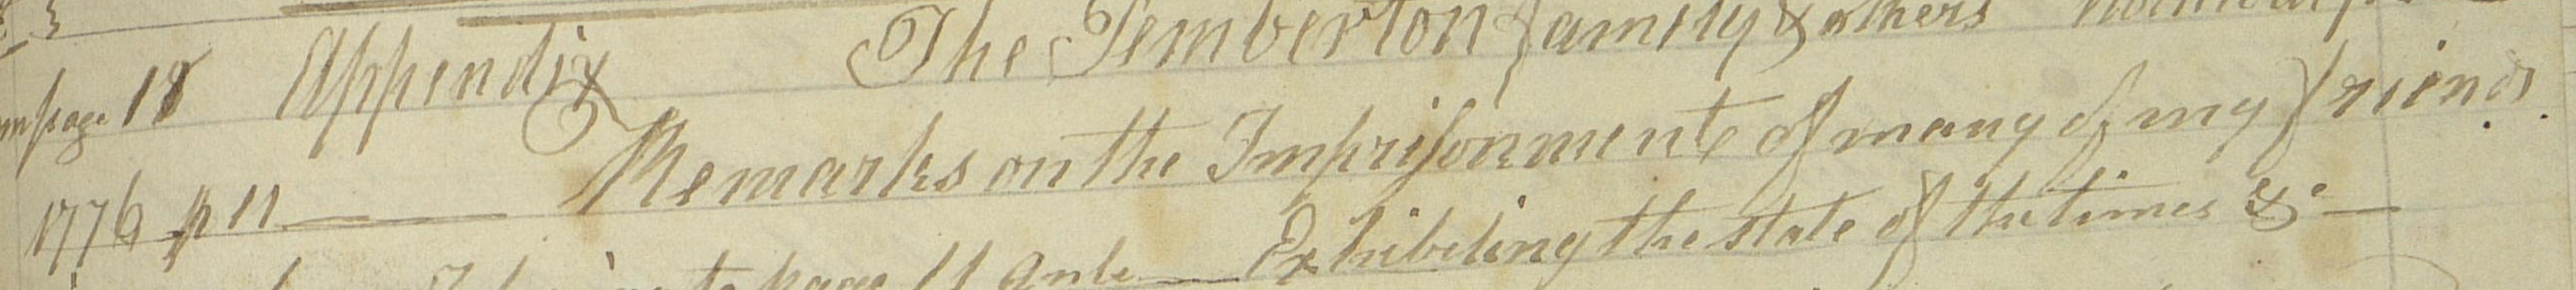1776 p11 Remarks on the Imprisonment of many of my friends
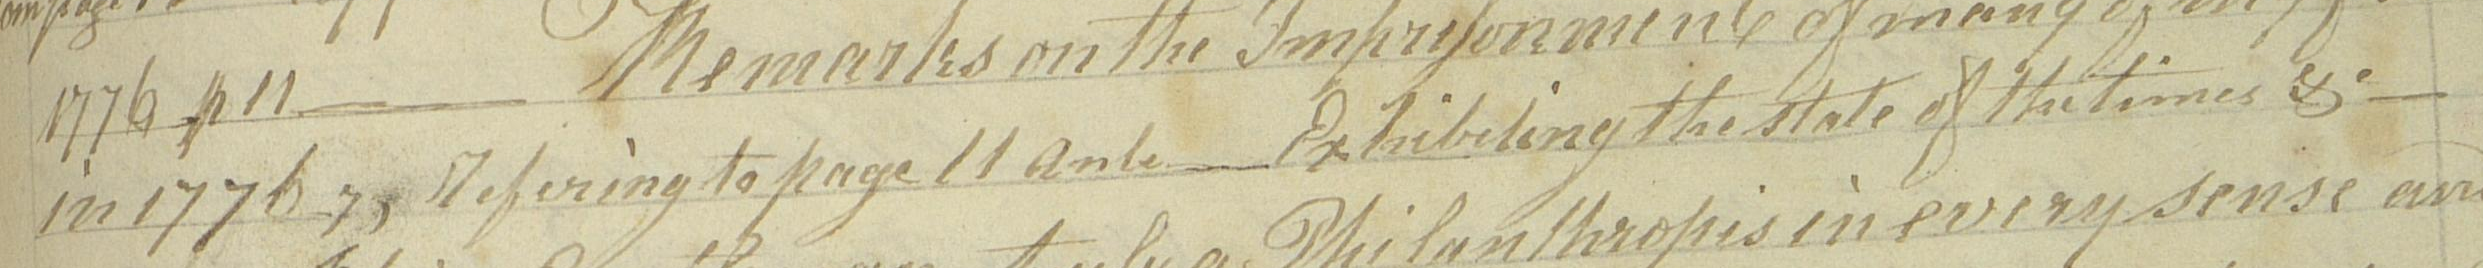In 1776-7, refering to page 11 ante Exhibiting the state of the times &^c
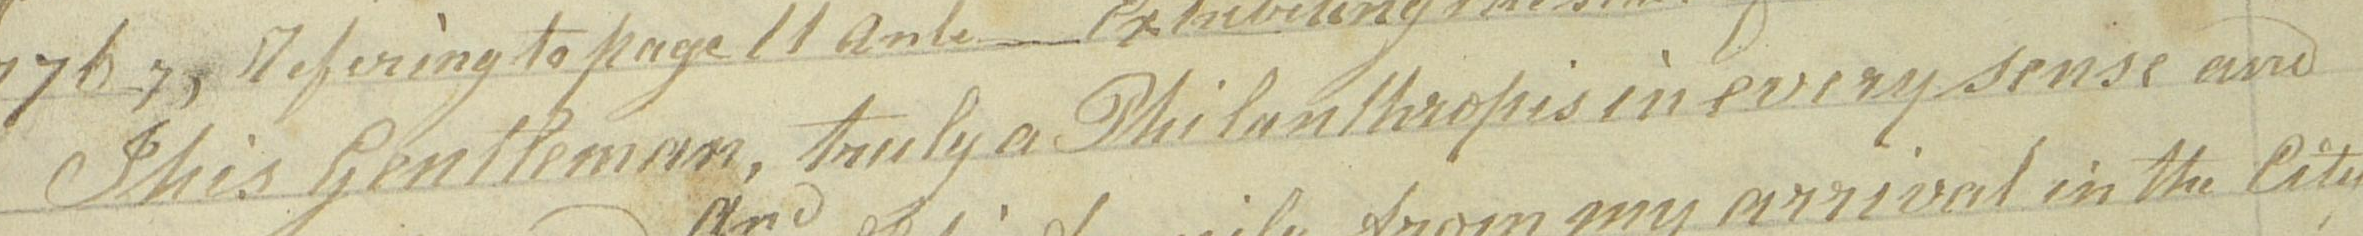This Gentleman, truly a Philanthropis in every sense and
